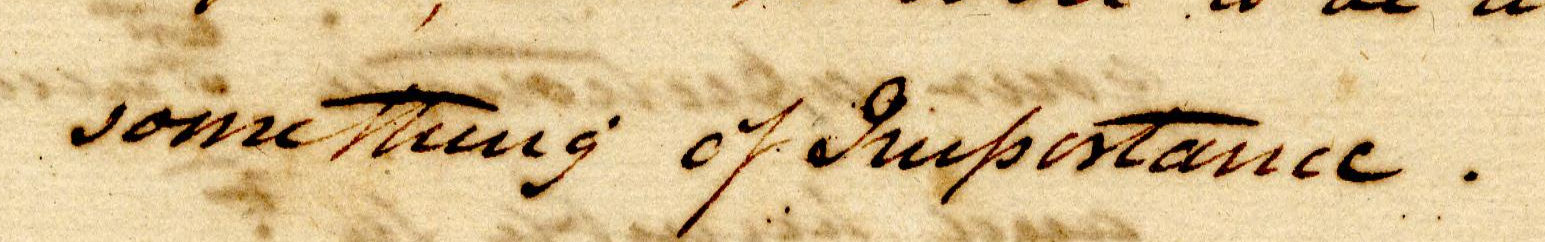something of Importance.
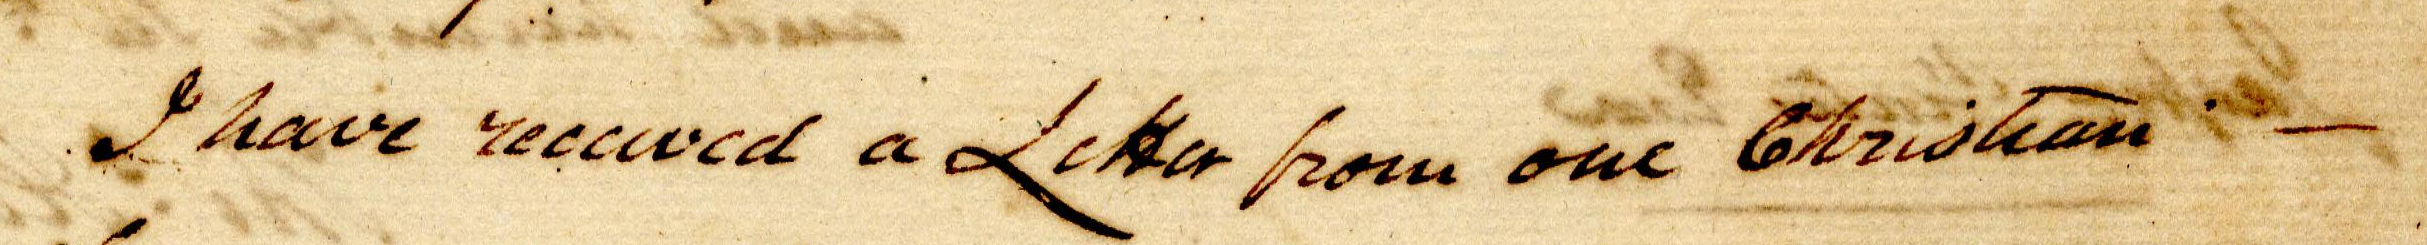I have received a Letter from one Christian
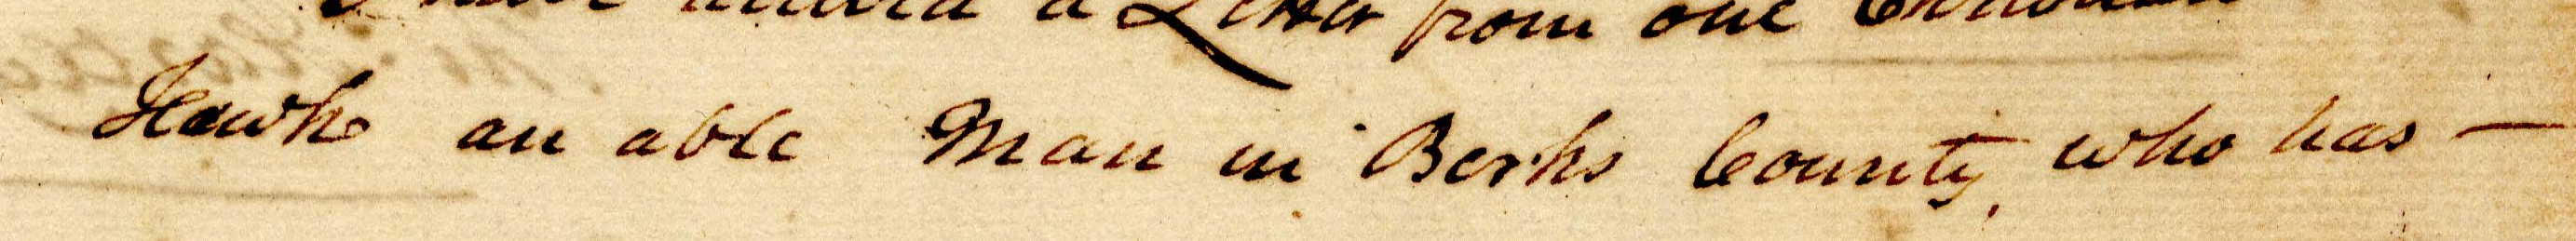Hawk an able man in Berks County who has
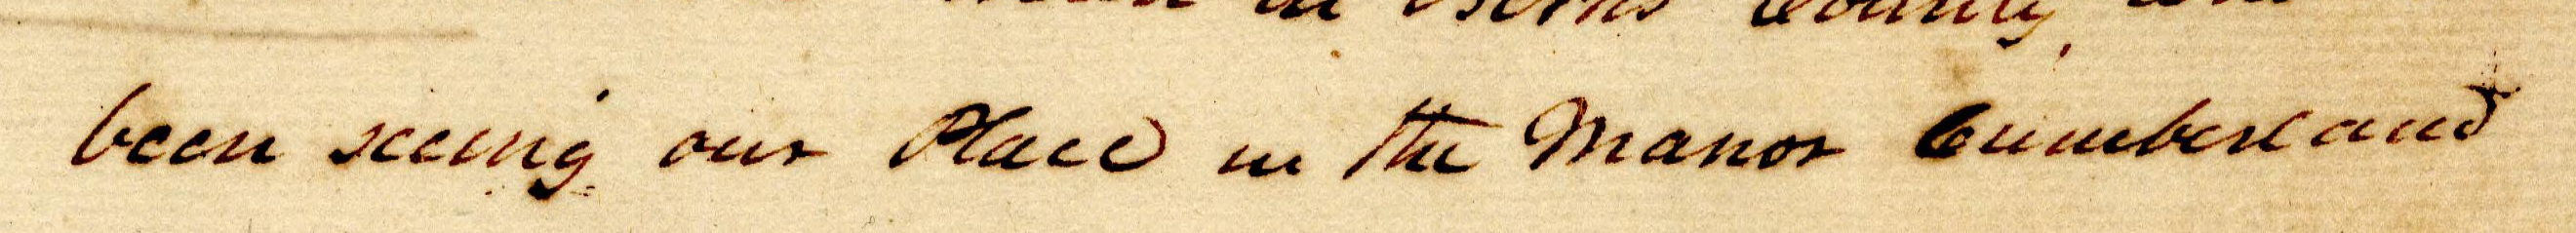been seeing our Place in the manor Cumberand
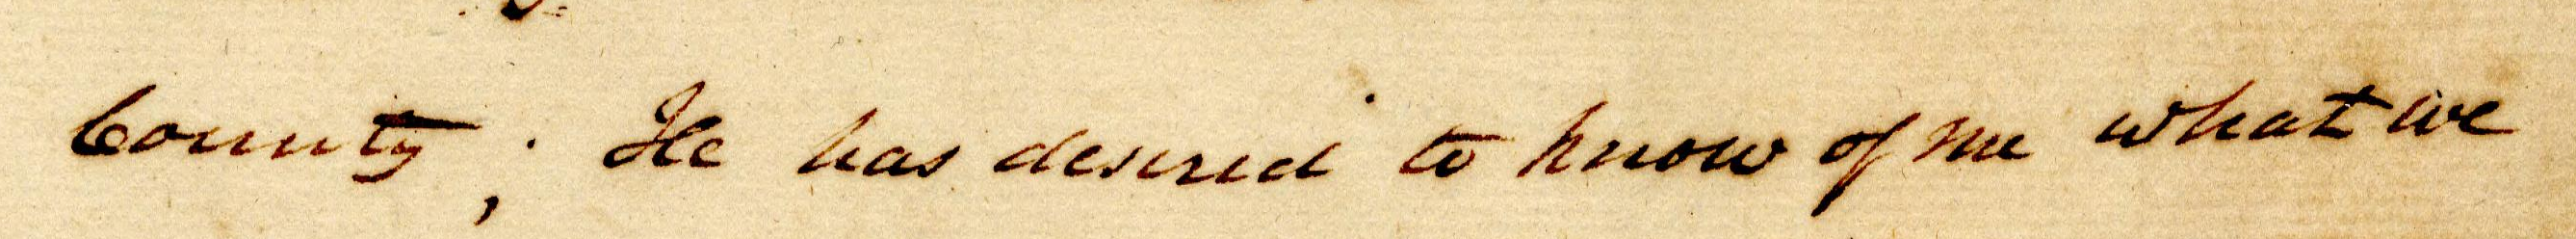County. He has desired to know of me what we
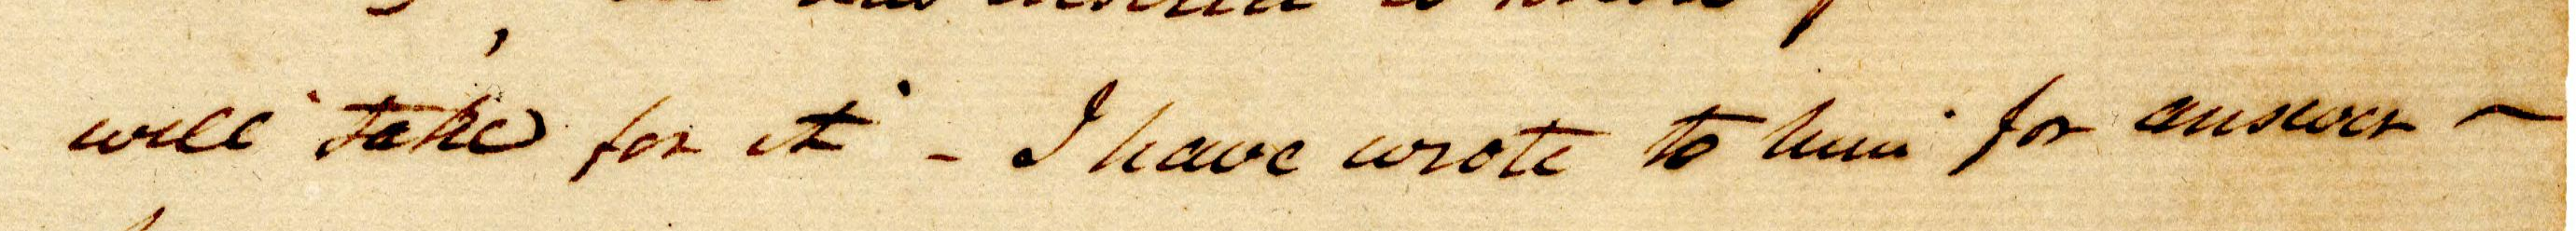will take for it. I have wrote to him for answer
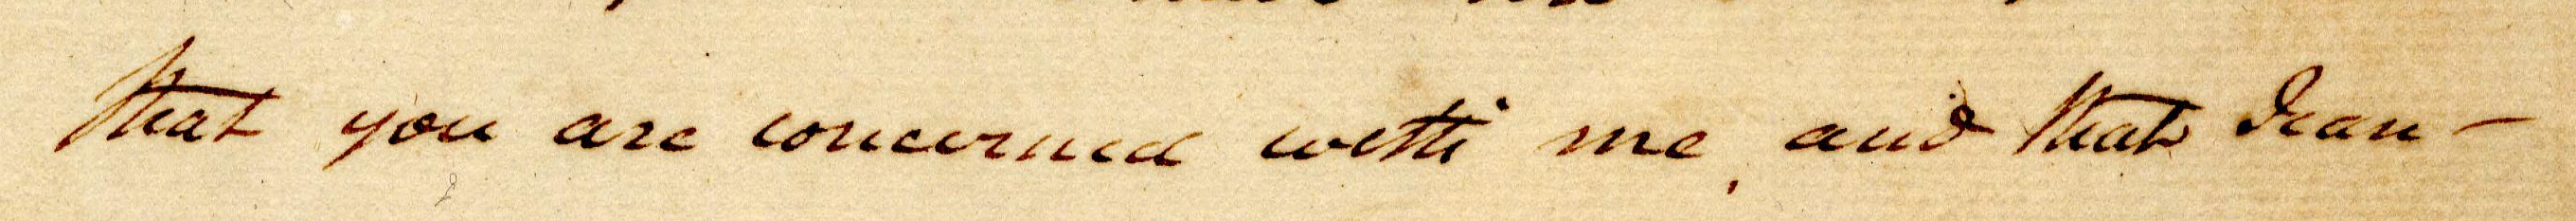teat you are concerned with me and that I can
